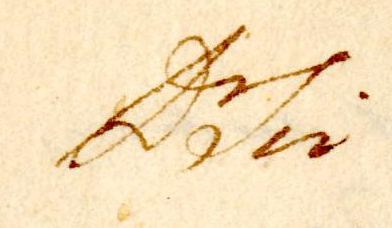D^r Sir
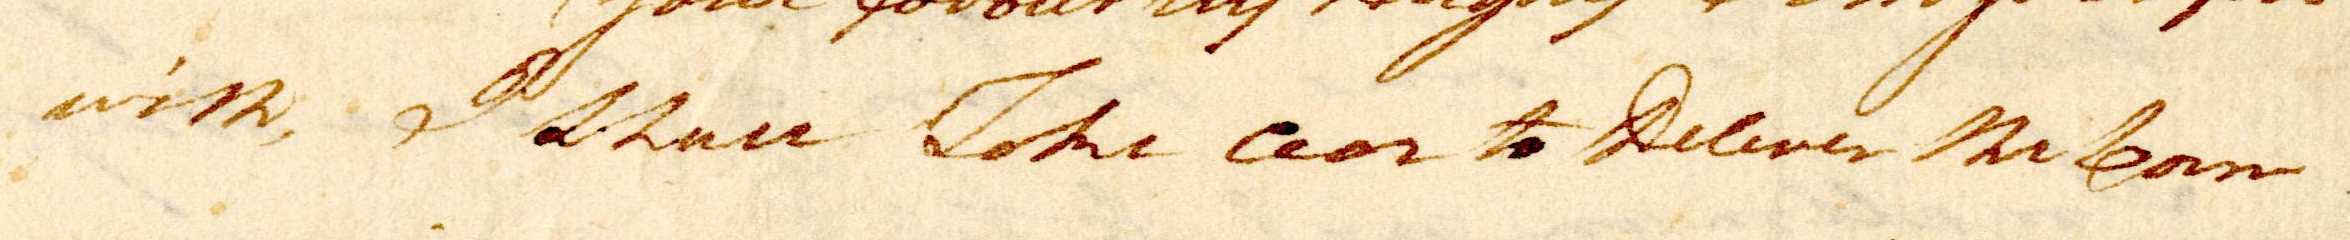with, I shall take care to Deliver the Corn
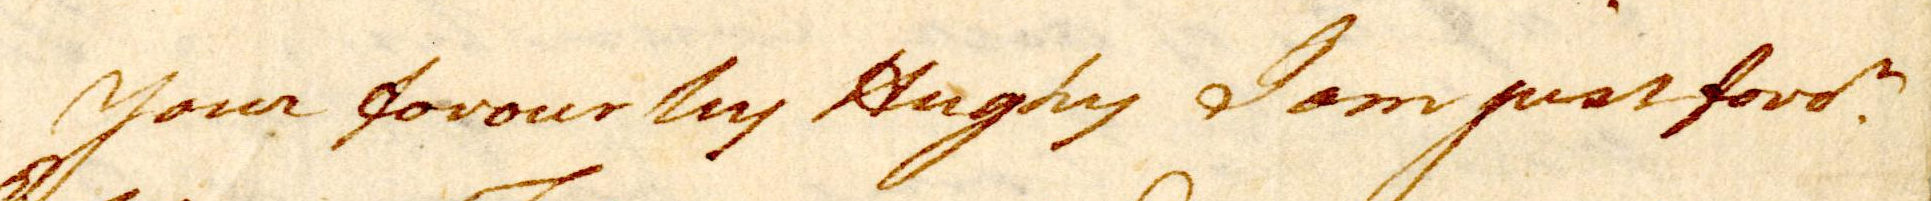Your favour by Hughy I am just favd.
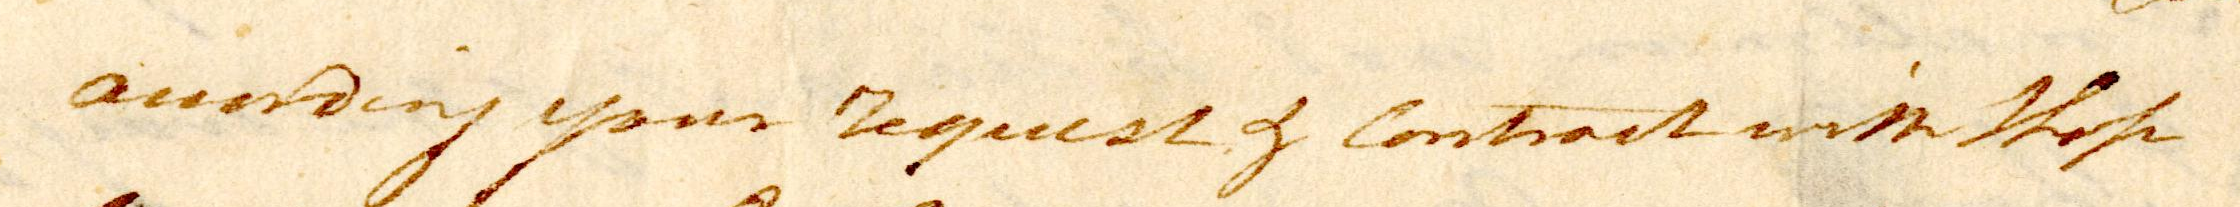according your request & Contract with these
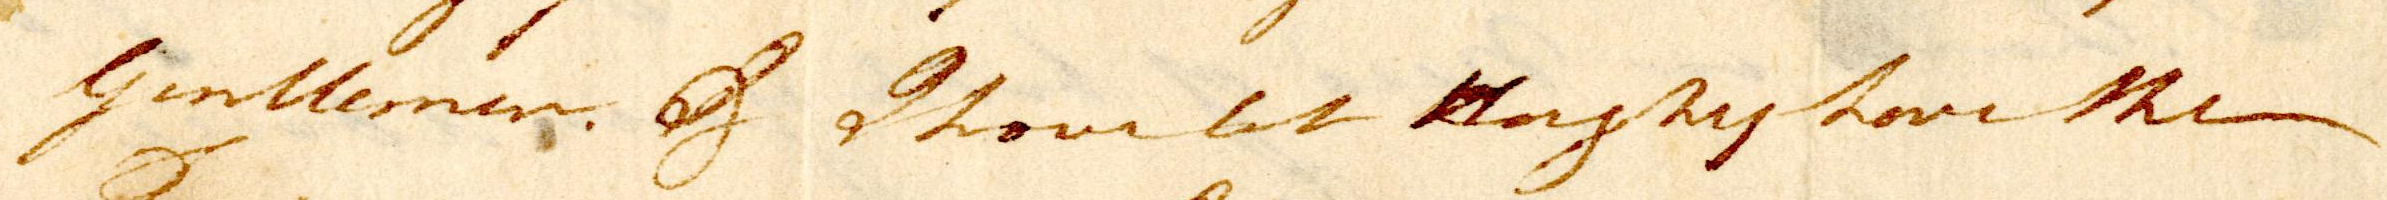Gentlemen. & I have let Hughy have the
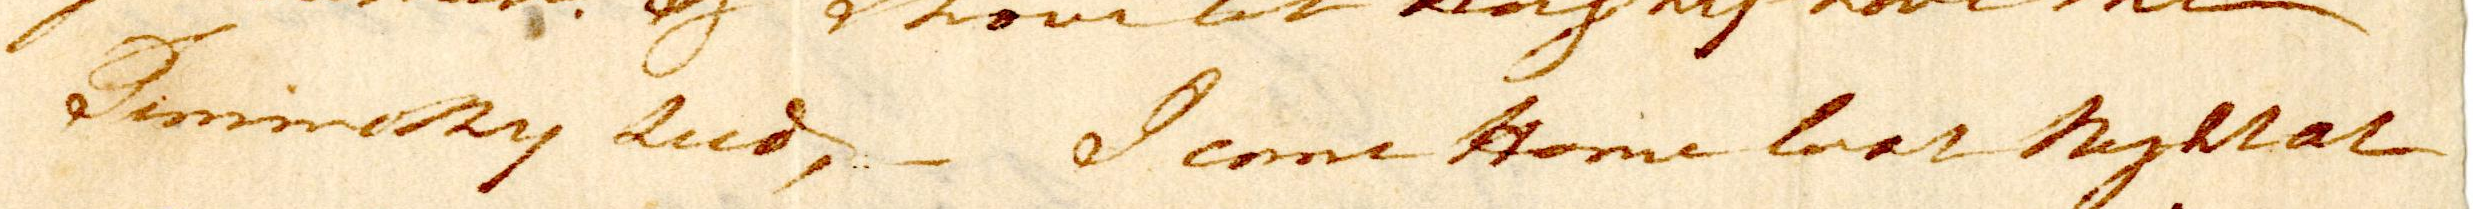Timmothy Leed.- I came Home last night at
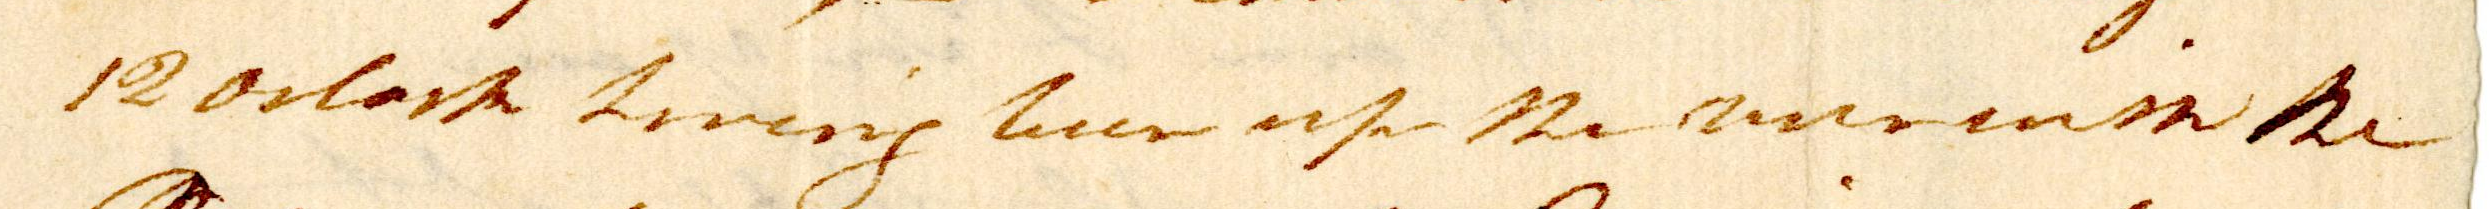12 Oclock having been up the river with the
